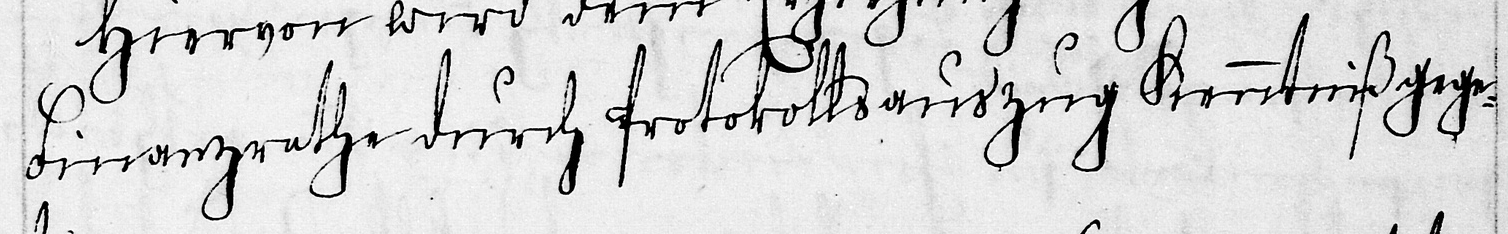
Finanzrathe durch Protokollsauszug Kenntniß gege¬
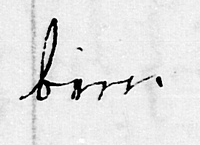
ben.
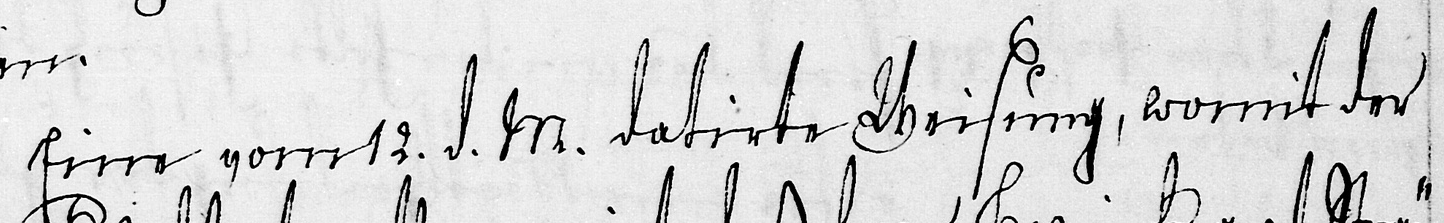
Eine vom 12. d. M. datirte Weisung, womit der
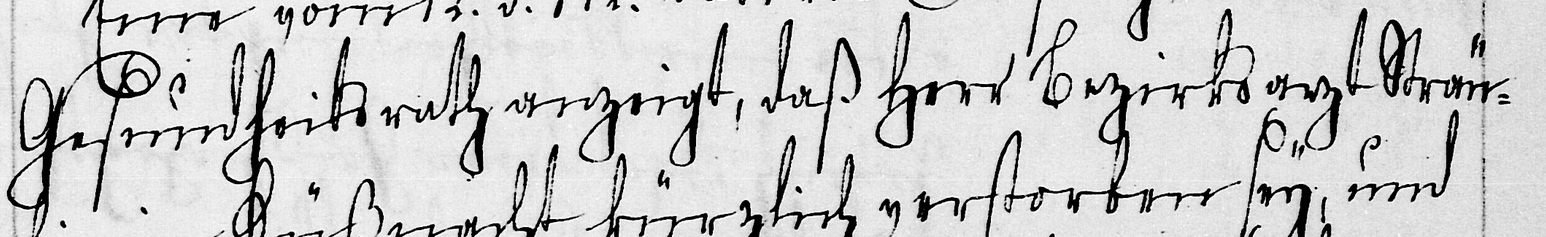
Gesundheitsrath anzeigt, daß Herr Bezirksarzt Sträu¬
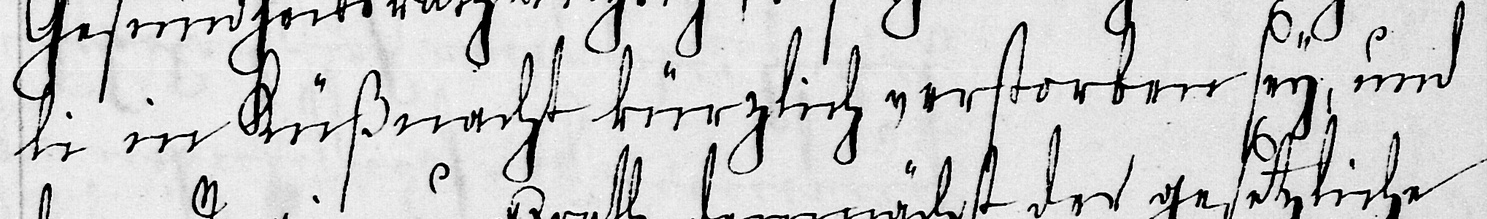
li in Küßnacht kürzlich verstorben sey, und
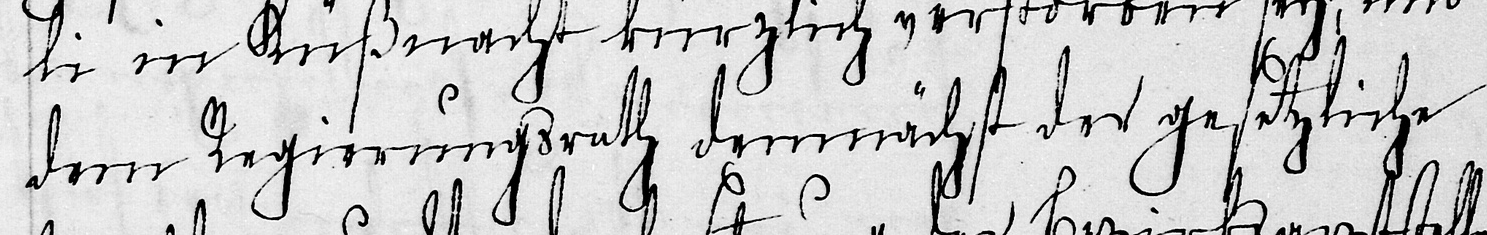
dem Regierungsrath demnächst der gesetzliche
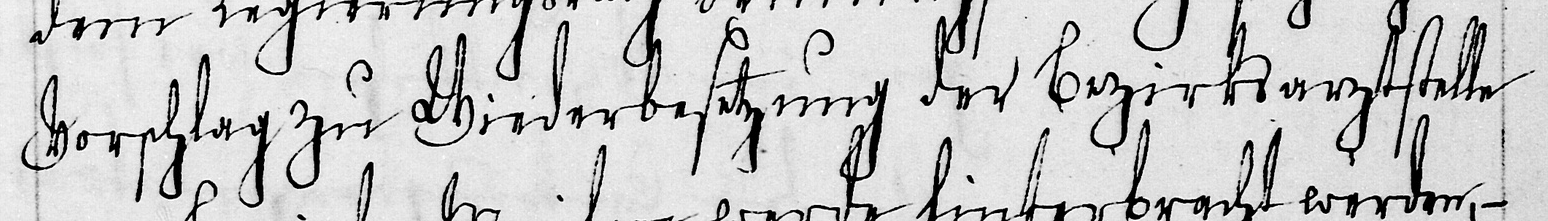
Vorschlag zu Wiederbesetzung der Bezirksarztstelle
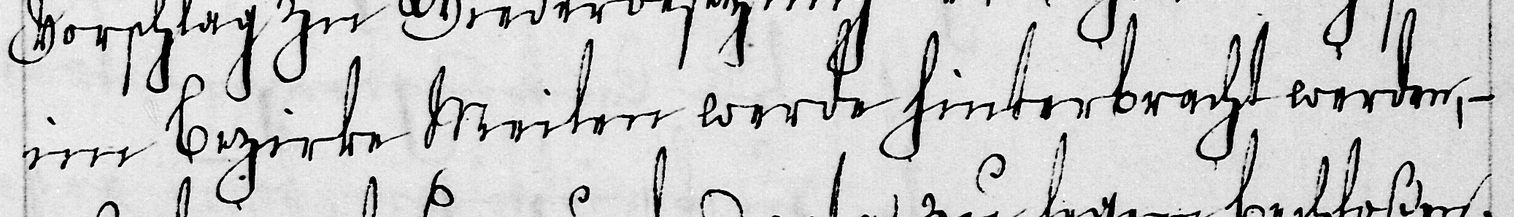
im Bezirke Meilen werde hinterbracht werden, –
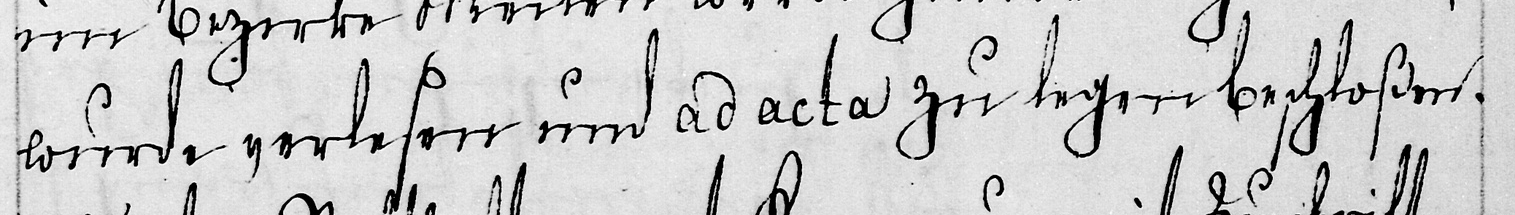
wurde verlesen und ad acta zu legen beschloßen.
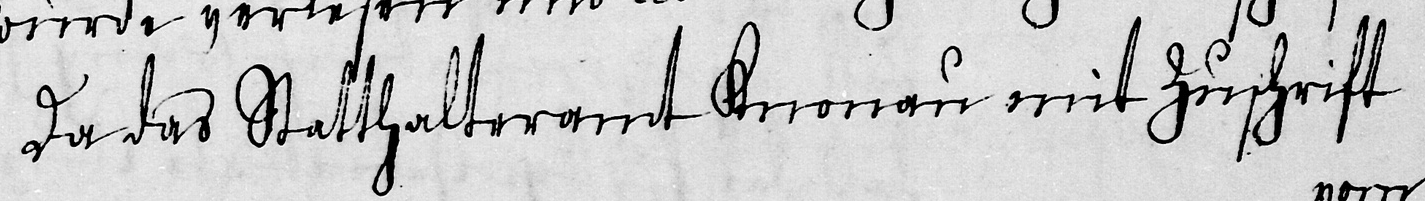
Da das Statthalteramt Knonau mit Zuschrift
